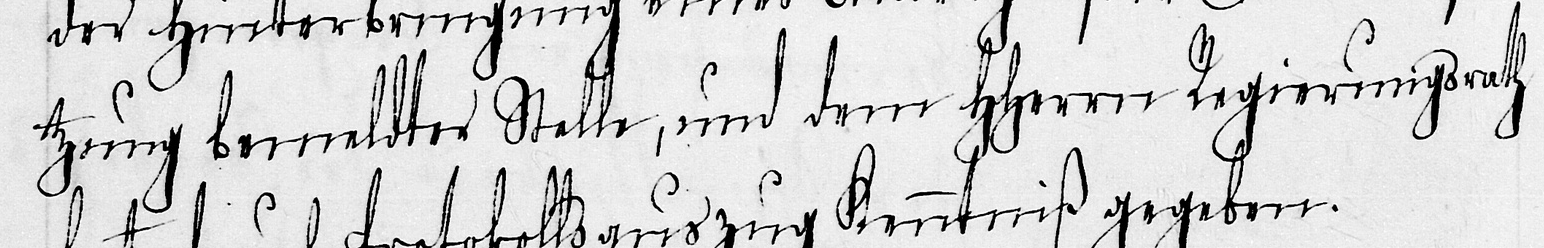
tzung bemeldter Stelle, und dem HHerrn Regierungsrath
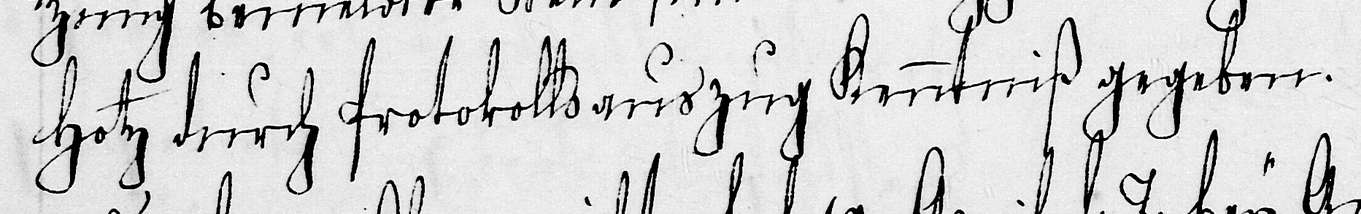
Hotz durch Protokollsauszug Kenntniß gegeben.
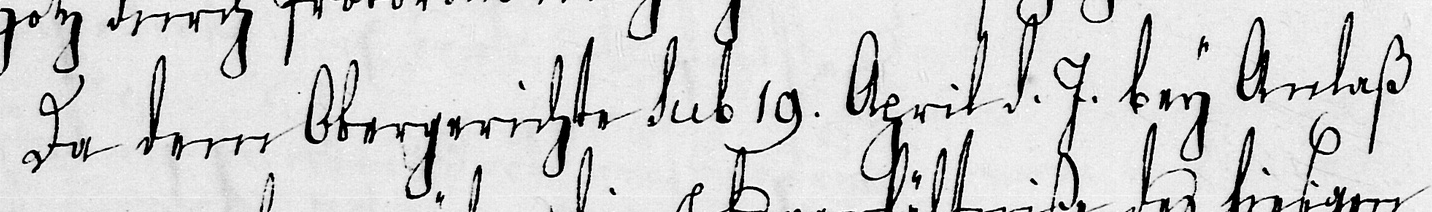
Da dem Obergerichte sub 19. April d. J. bey Anlaß
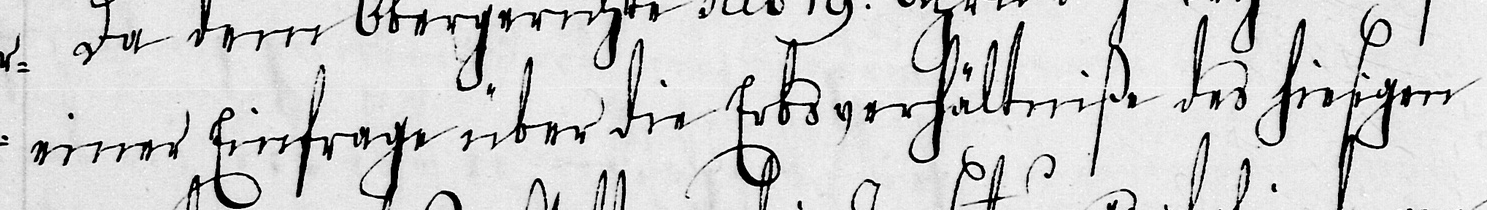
einer Einfrage über die Erbsverhältniße des hiesigen
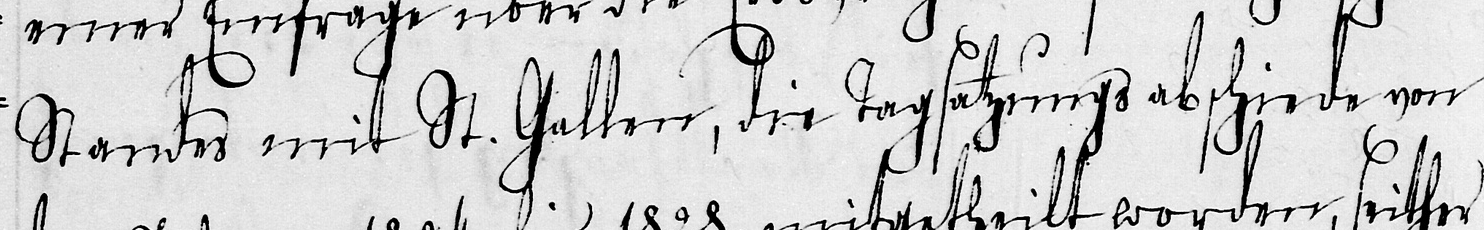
Standes mit St. Gallen, die Tagsatzungsabschiede von
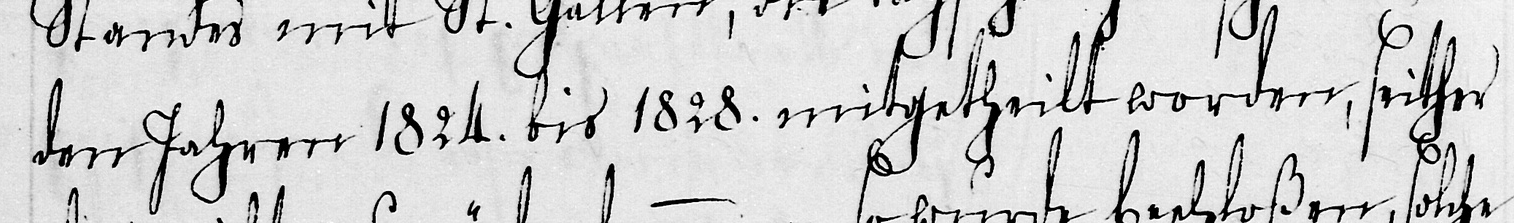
den Jahren 1824. bis 1828. mitgetheilt worden, seither
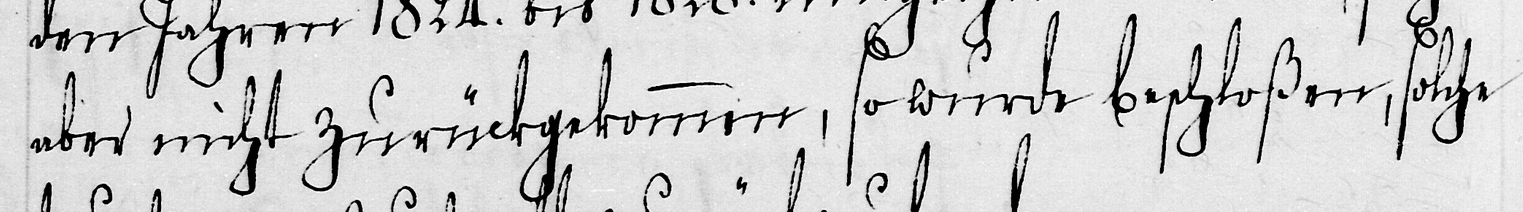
aber nicht zurückgekommen, so wurde beschloßen, solche
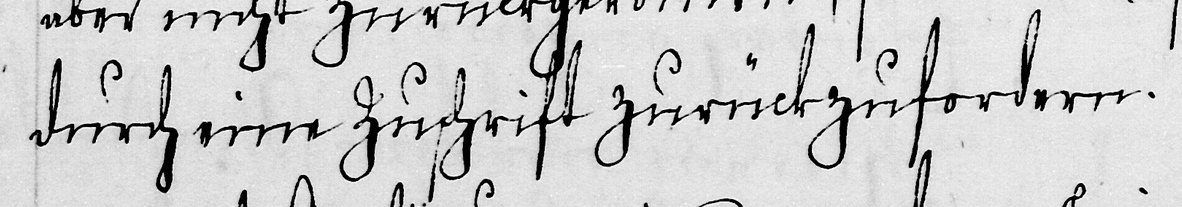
durch eine Zuschrift zurückzufordern.
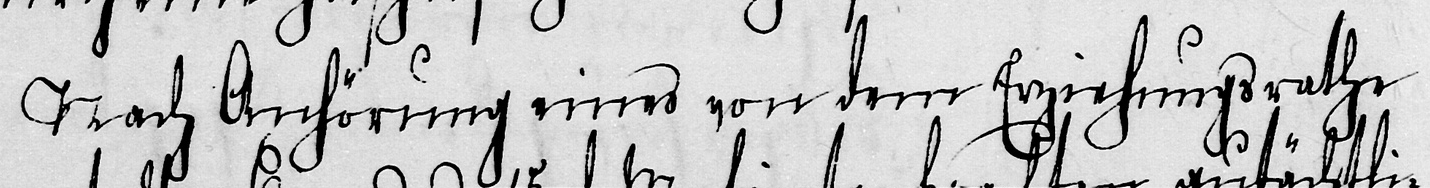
Nach Anhörung eines von dem Erziehungsrathe
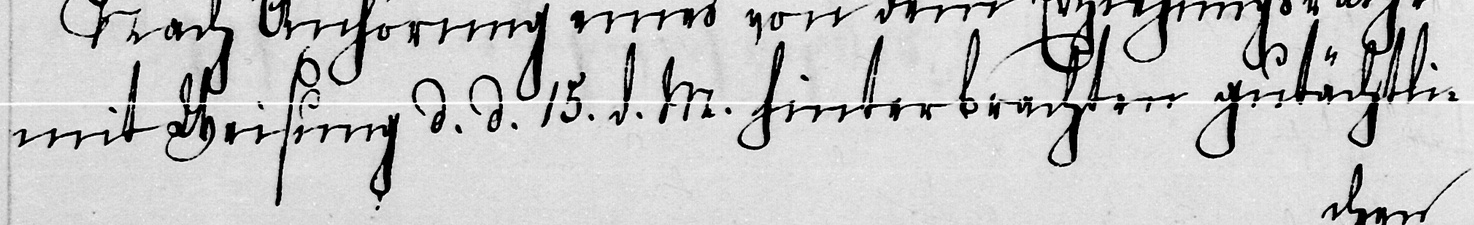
mit Weisung d. d. 15. d. M. hinterbrachten gutächtli-
